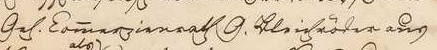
Geh. Commerzienrath G. Bleichröder aus
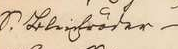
S. Bleichröder
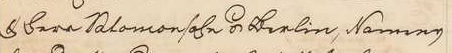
& Herr Salomonsohn aus Berlin, Namens
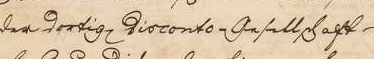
der dortigen Disconto-Gesellschaft
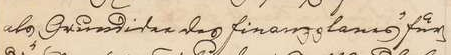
als «Grundidee des Finanzplanes» für
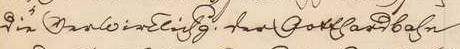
die Verwirklichg. der Gotthardbahn
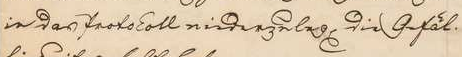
in das Protokoll niederzulegen die Gefäl-
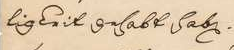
ligkeit gehabt haben.
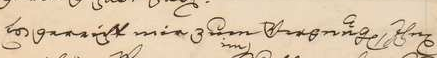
Es gereicht mir zum Vergnügen, Ihnen
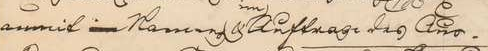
anmit im Namens & im Auftrage des Aus-
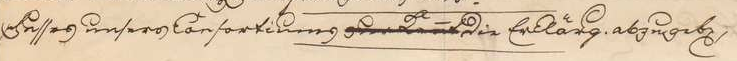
schusses unsers Consortiums zur Kennt, niß zu bringen die Erklärg.
